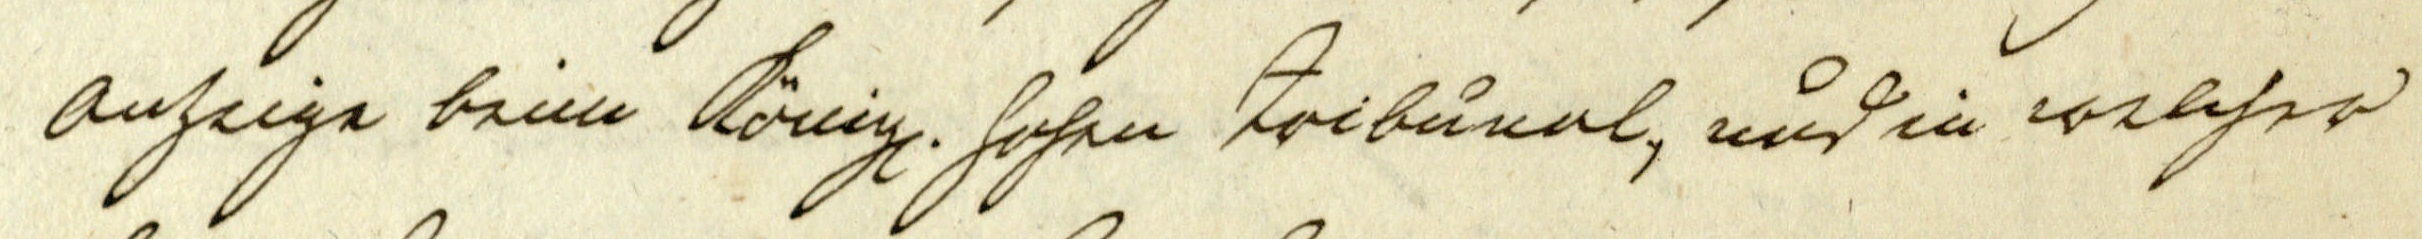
Anzeige beim Königl. hohen Tribunal, und in welcher
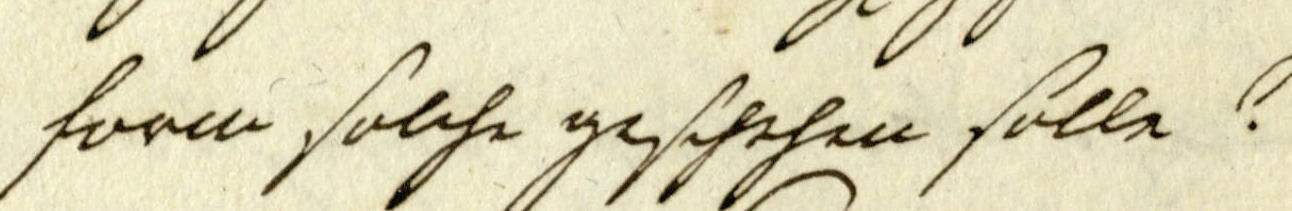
Form solche geschehen solle!
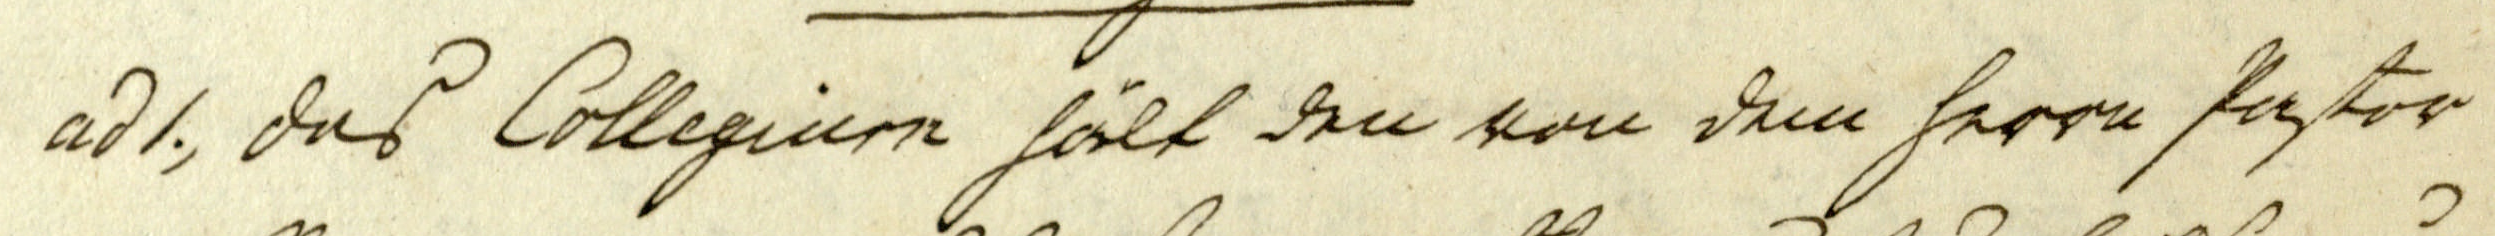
ad 1., Das Collegium hält den von dem herrn Pastor
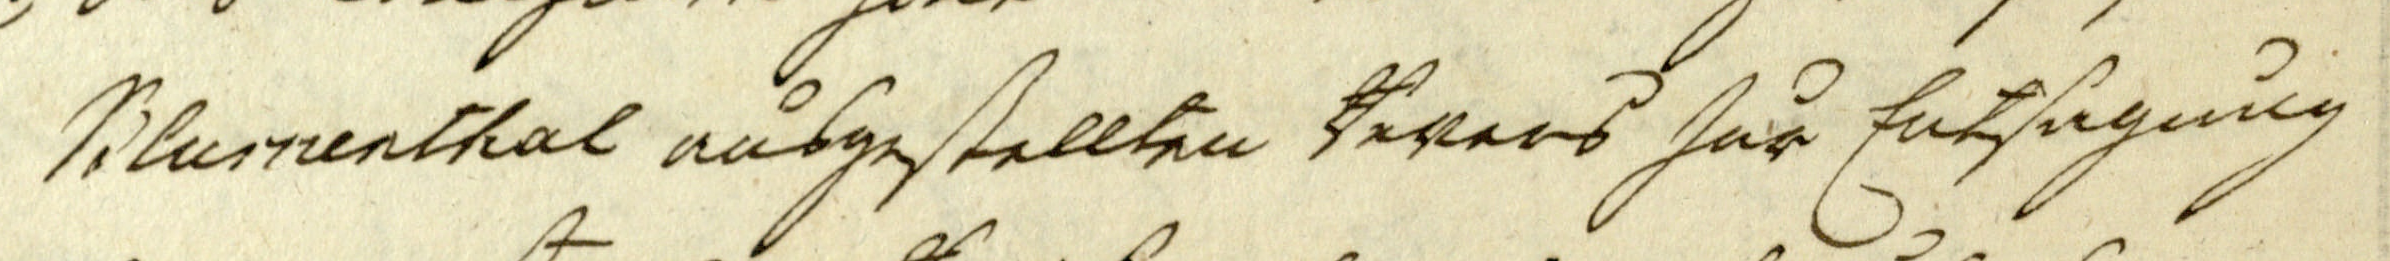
Blumenthal ausgestellten Revers zur Entsagung
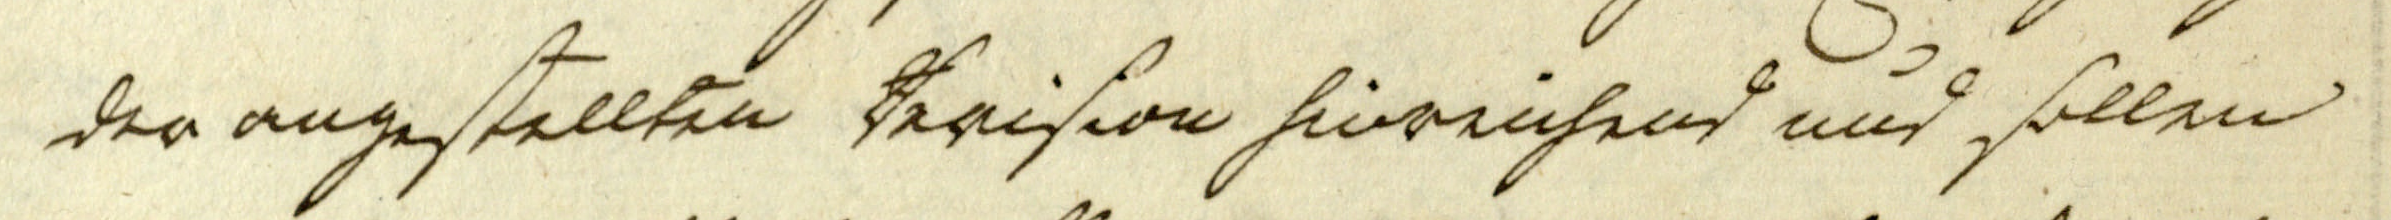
der angestellten Revision hinreichend und sollen
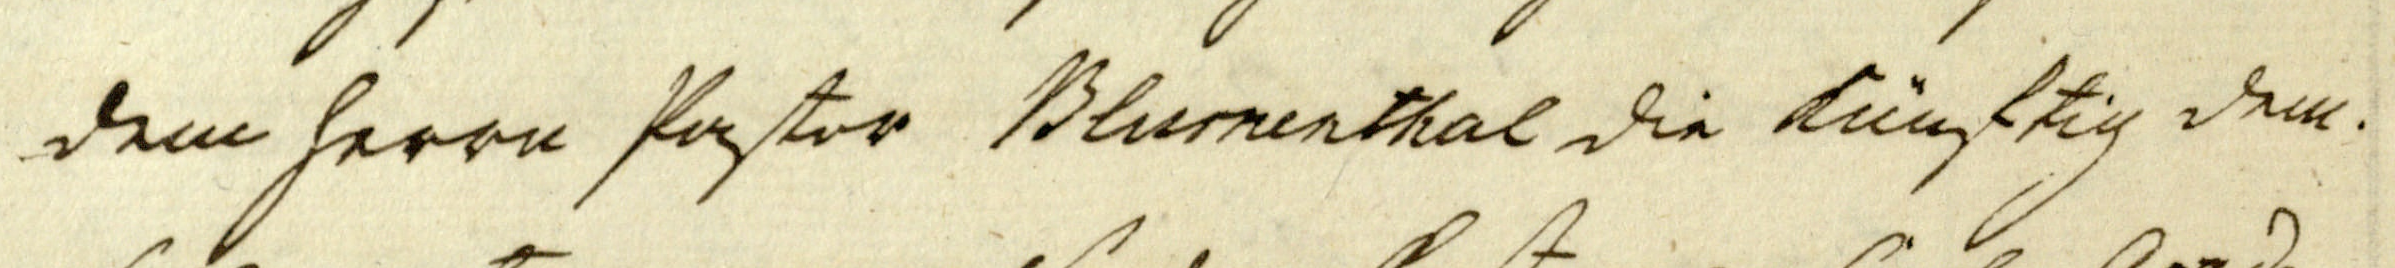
dem herrn Pastor Blumenthal die künftig dem¬
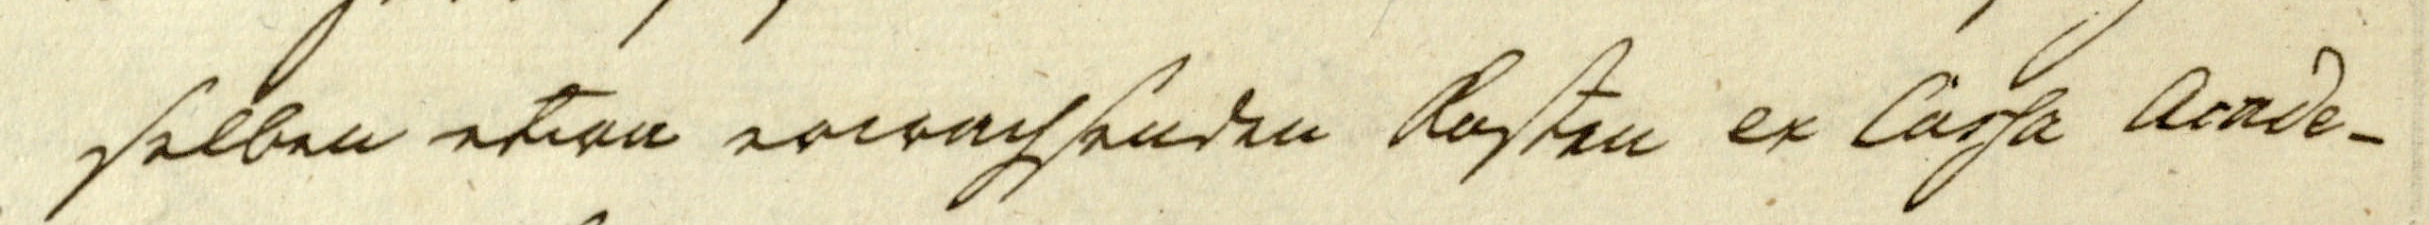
selben etwa erwachsenden Kosten ex Cassa Acade¬
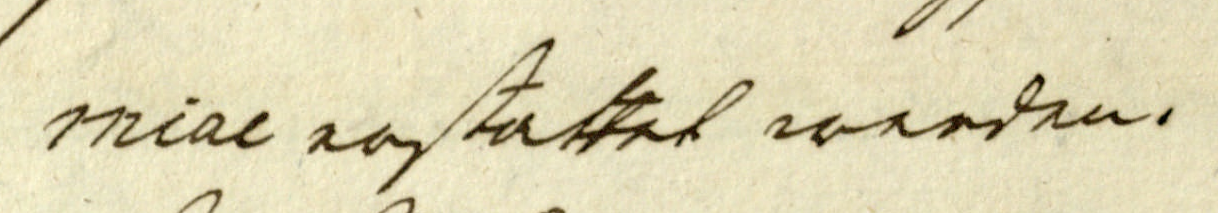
miae erstattet werden.
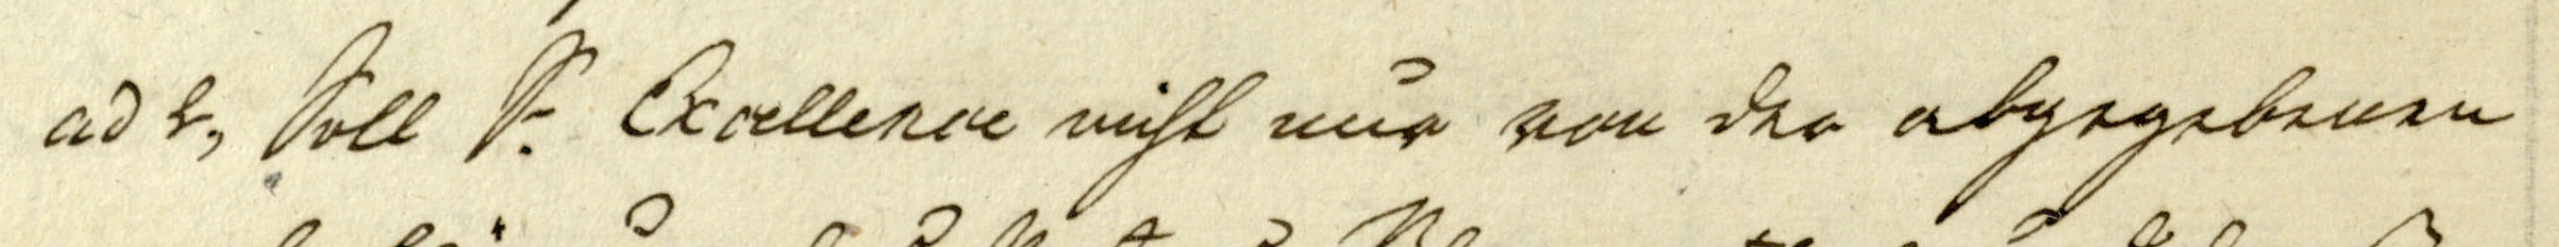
ad 2., Soll Sr. Excellence nicht nur von der abgegebenen
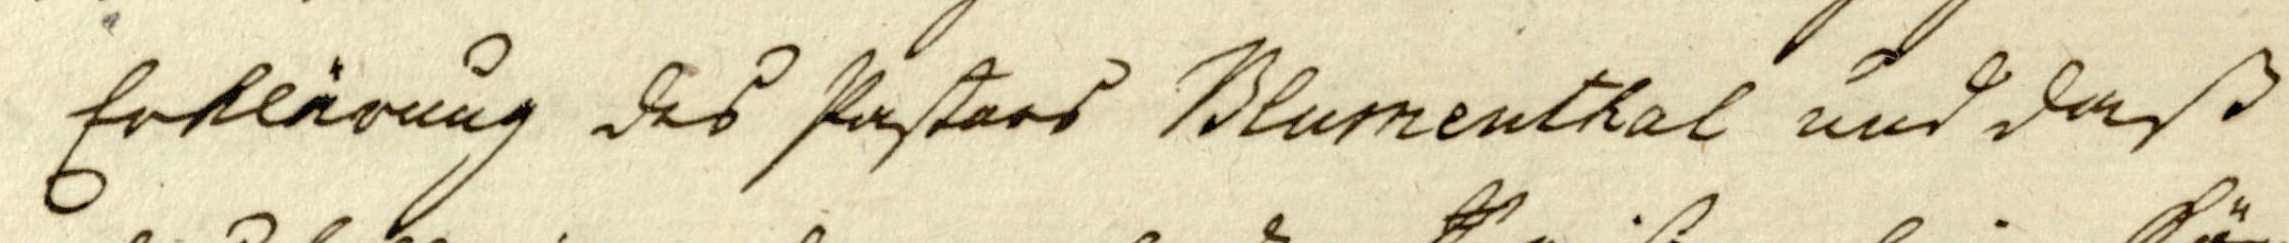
Erklärung des Pastors Blumenthal und daß
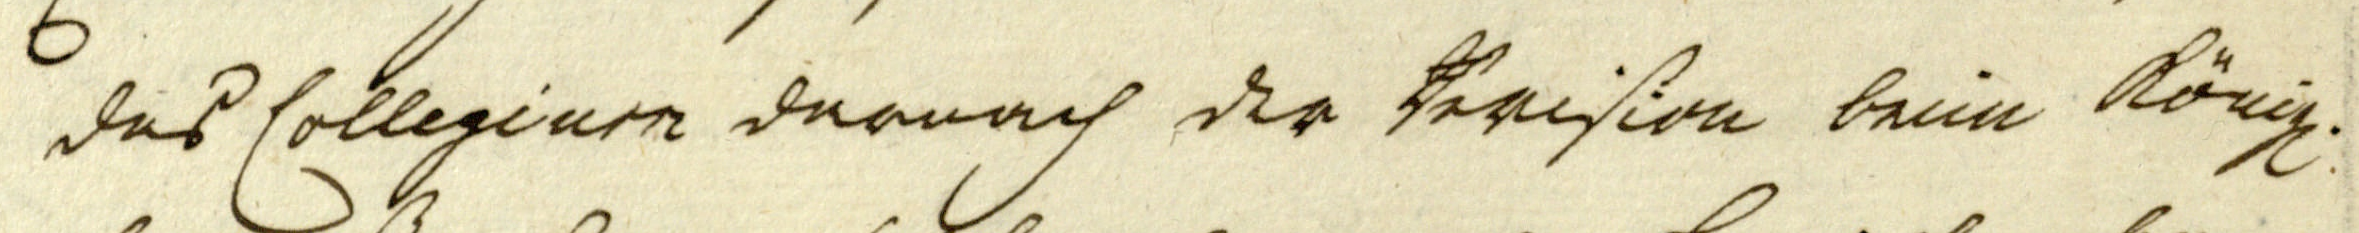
das Collegium darnach der Revision beim Königl.
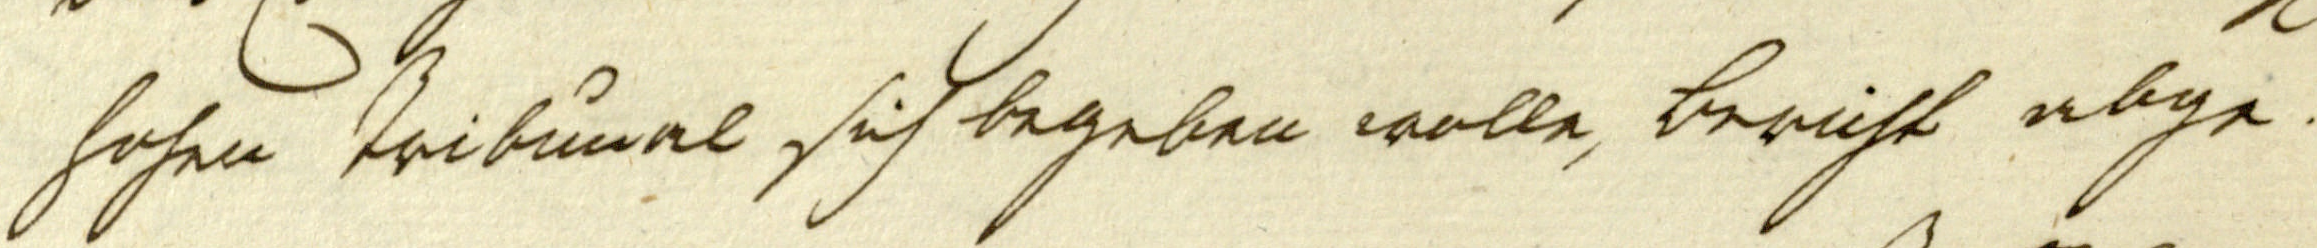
hohen Tribunal sich begeben wolle, Bericht abge¬
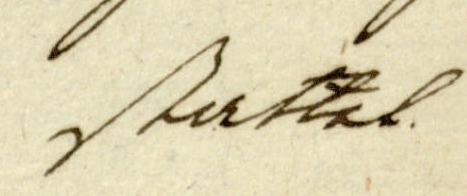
stattet.
